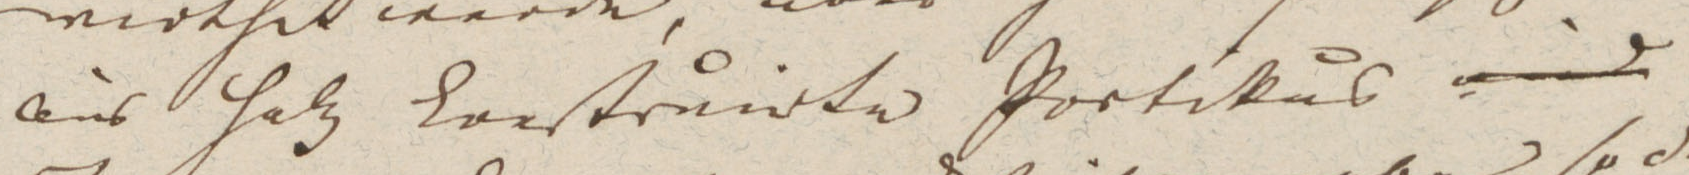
aus Holz konstruirte Portikus und
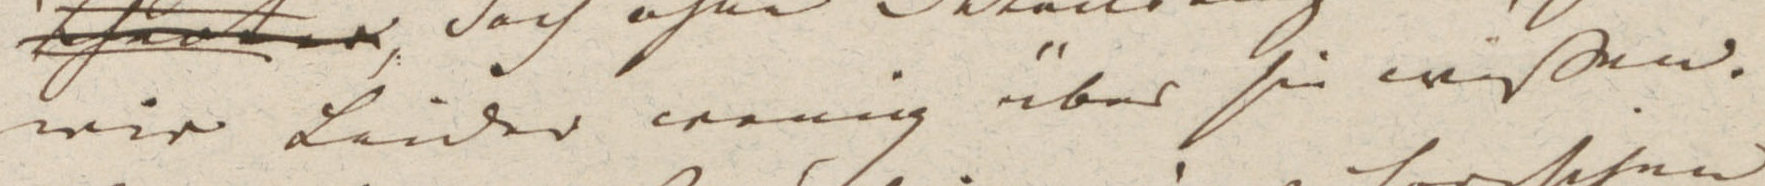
wir Leider wenig über sie wissen.
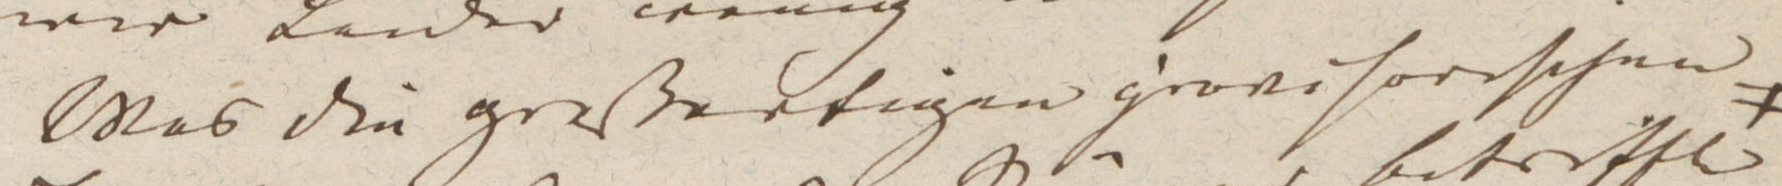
Was die grossartigen provisorischen
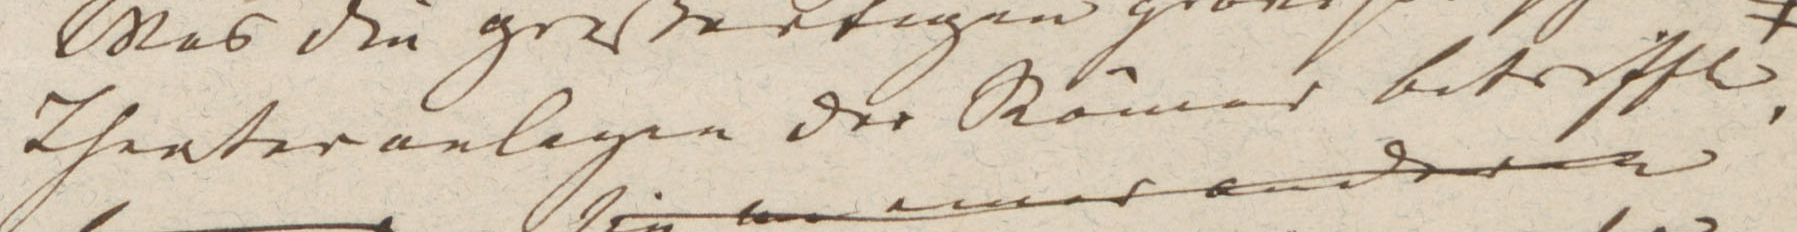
Theateranlagen der Römer betrifft, %
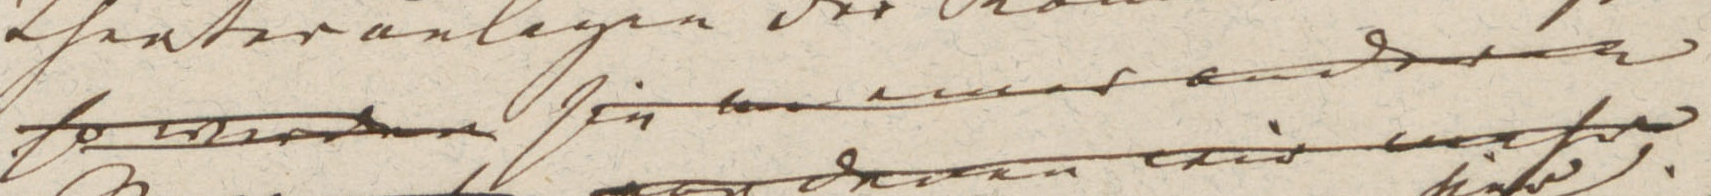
so werden sie an einer anderen
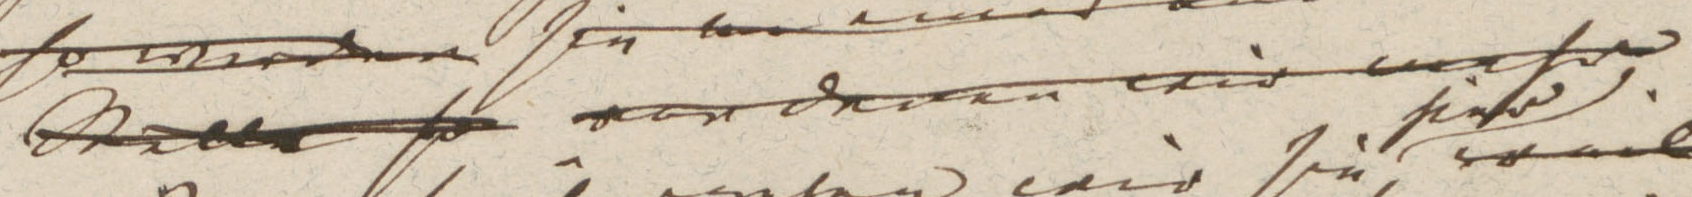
Stelle so von denen wir mehr
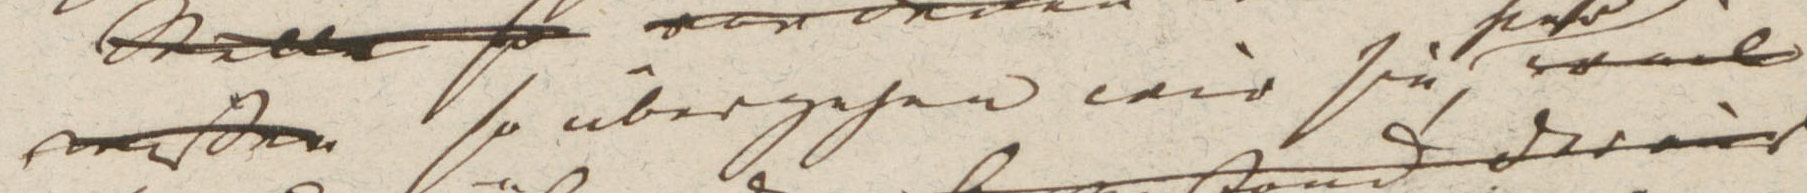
wissen so übergehen wir sie, hier weil
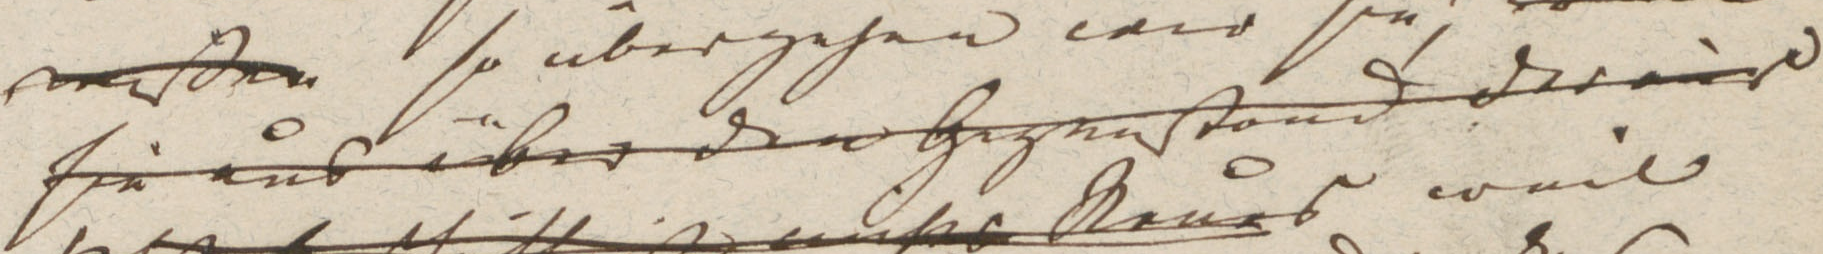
sie uns über den Gegenstand der uns
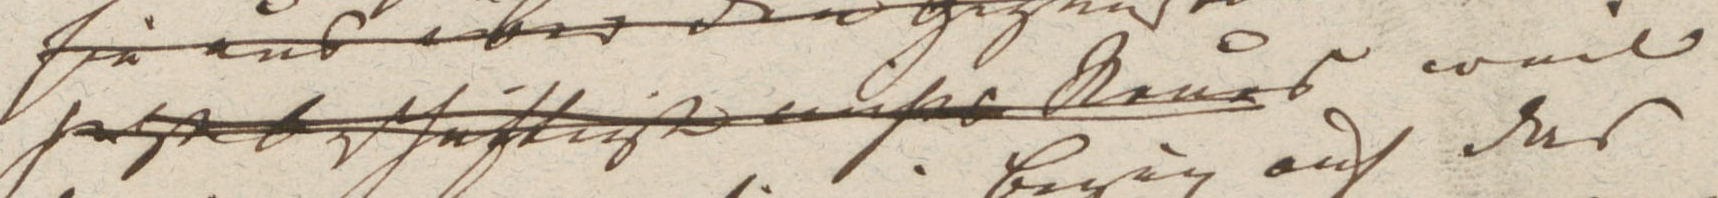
jetzt beschäftigt nichts Neues weil
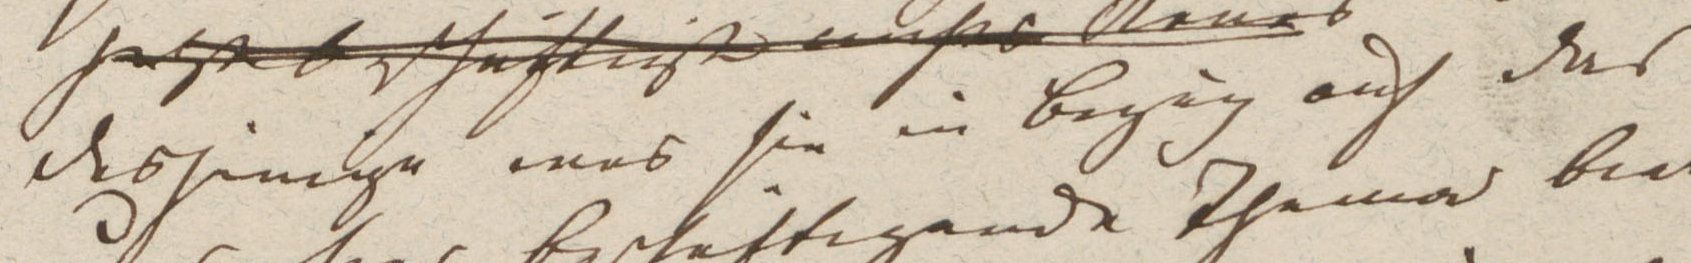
dasjenige was sie in Bezug auf das
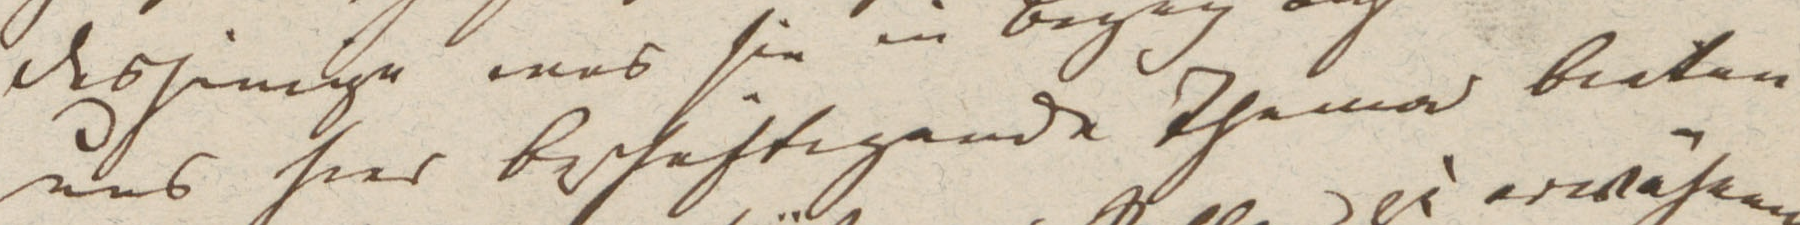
uns hier beschäftigende Thema bieten
